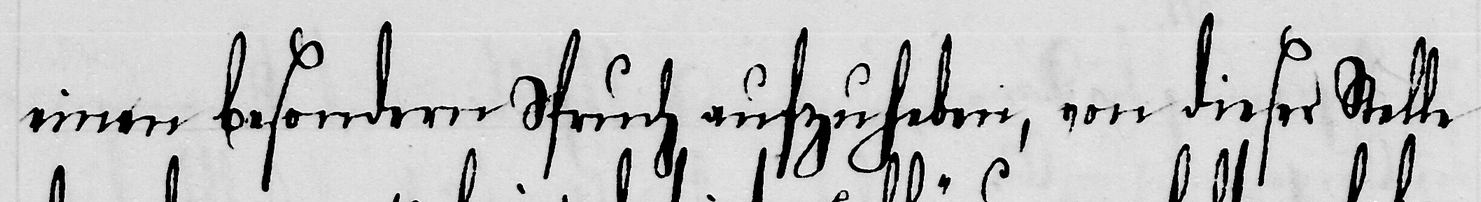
einen besondern Spruch aufzuheben, von dieser Stel¬
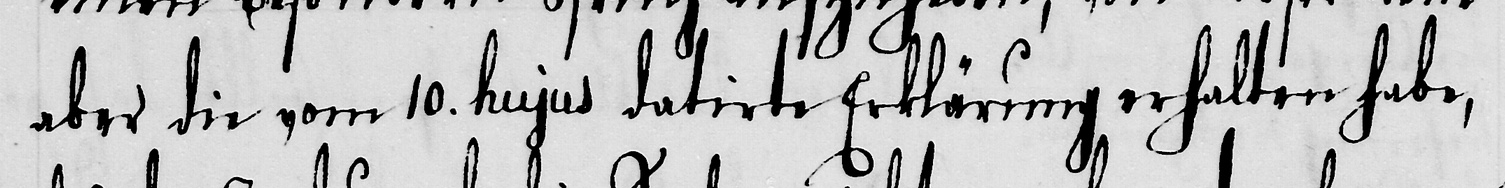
aber die vom 10. hujus datirte Erklärung erhalten habe,
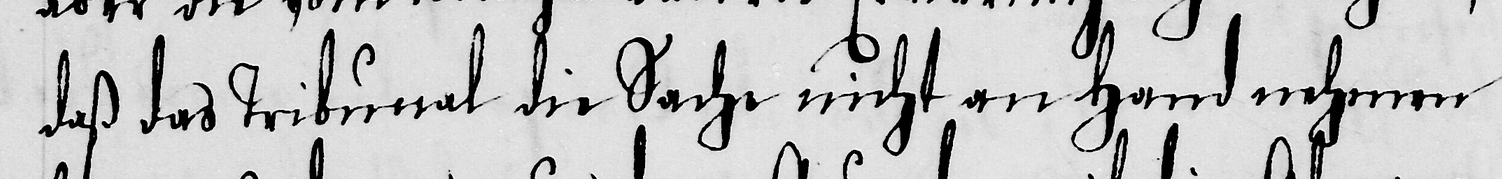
daß das Tribunal die Sache nicht an Hand nehmen
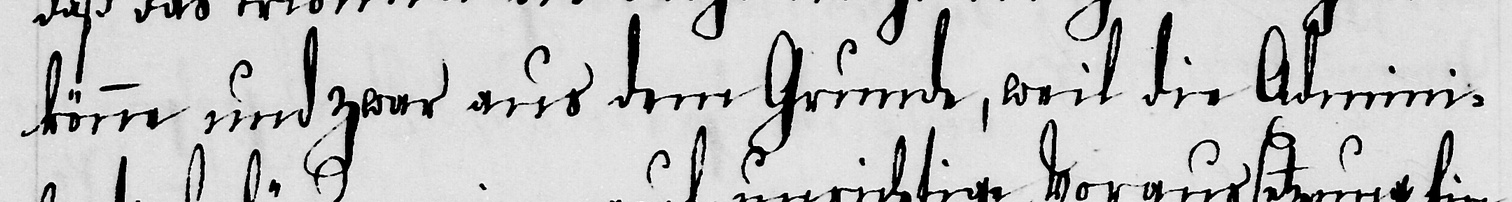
könne und zwar aus dem Grunde, weil die Admini¬
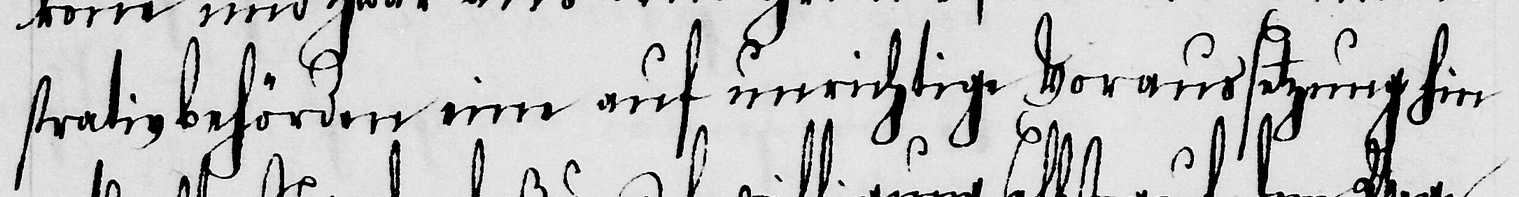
strativbehörden eine auf unrichtige Voraussetzung hin
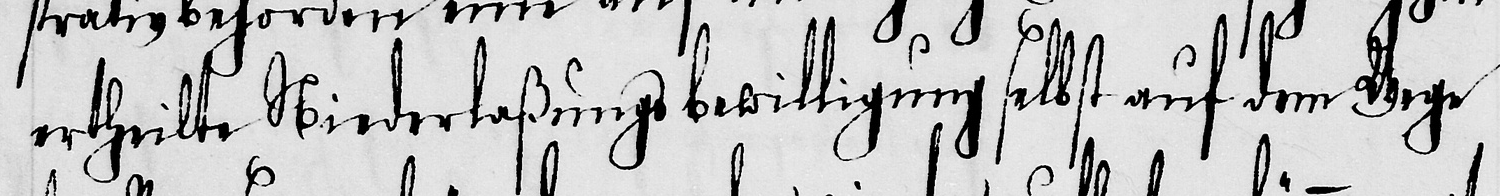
ertheilte Niederlaßungsbewilligung selbst auf dem Wege
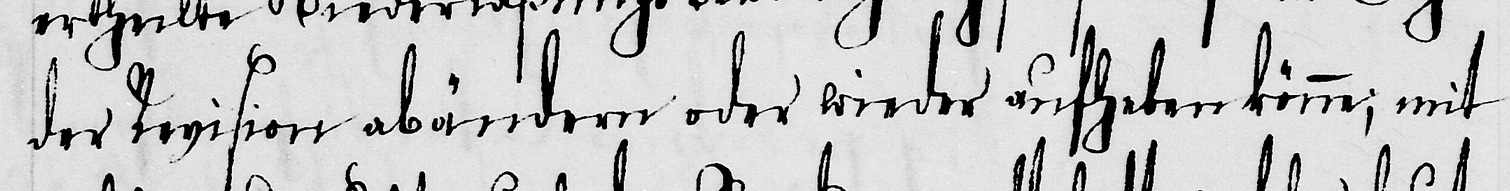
der Revision abändern oder wieder aufheben könne; mit
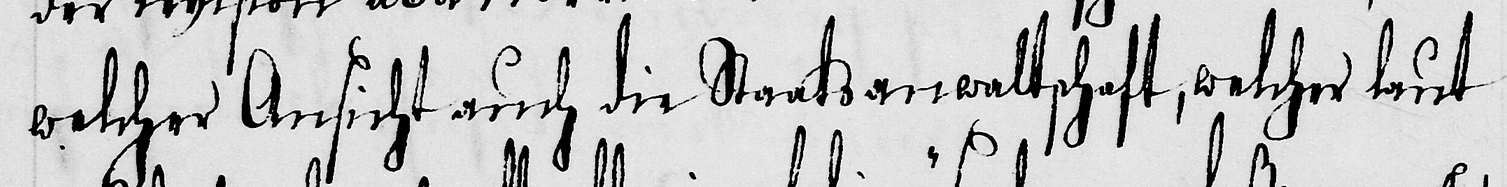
welcher Ansicht auch die Staatsanwaltschaft, welcher laut
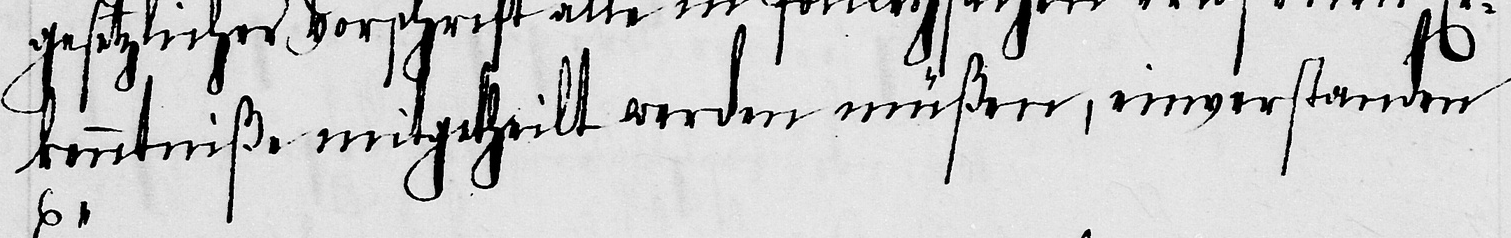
kenntniße mitgetheilt werden müßen, einverstanden
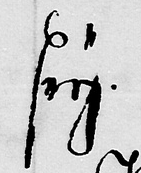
an¬
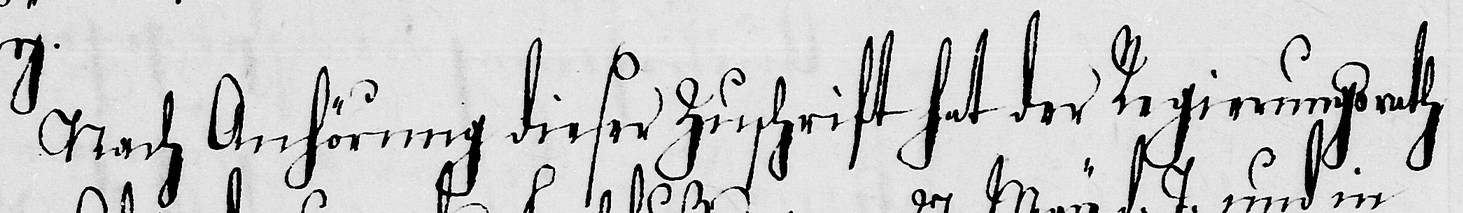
Nach Anhörung dieser Zuschrift hat der Regierungsrath
